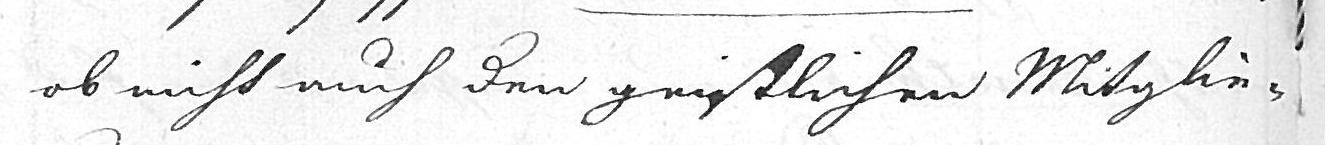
ob nicht auch den geistlichen Mitglie-
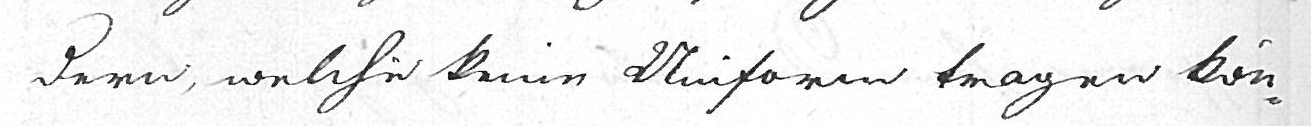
dern, welche keine Uniform tragen kön-
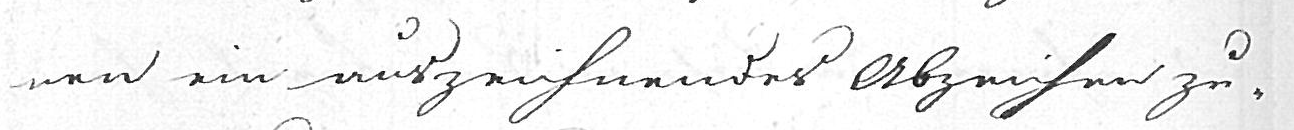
nen ein auszeichnendes Abzeichen zu-
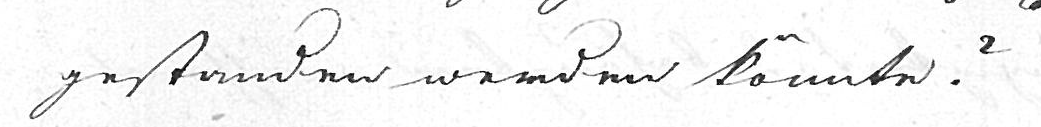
gestanden werden könnte?
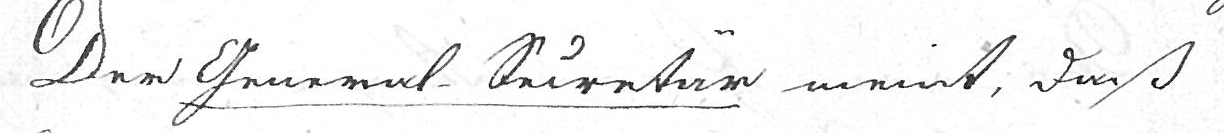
Der General-Secretär meint, daß
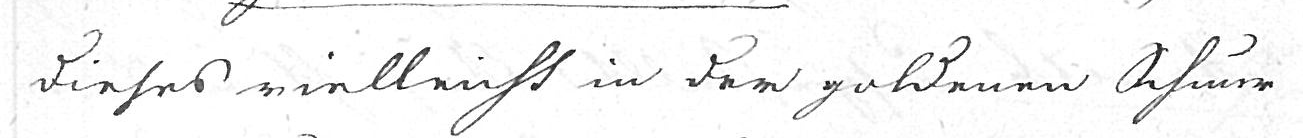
diese vielleicht in der goldenen Schnur
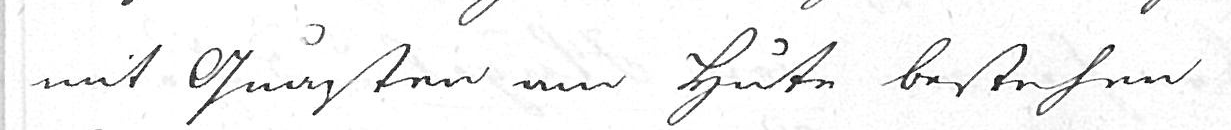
mit Quasten am Hute bestehen
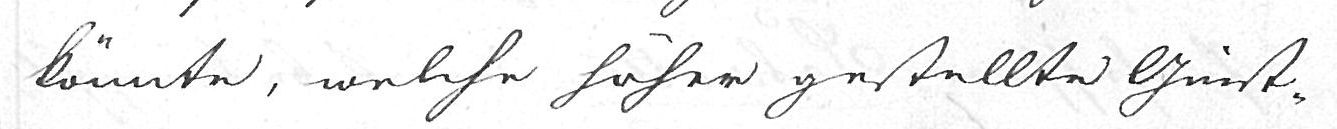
könnte, welche höher gestellte Geist-
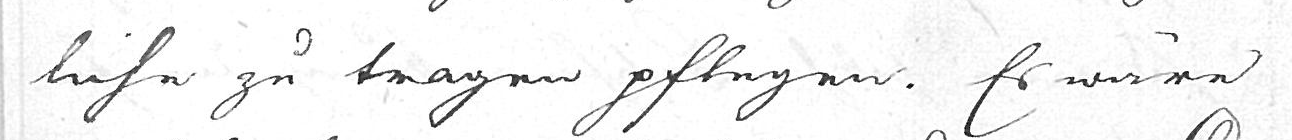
liche zu tragen pflegen. Es wäre
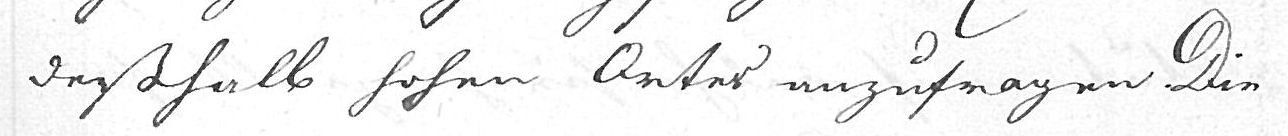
deßhalb hohen Ortes anzufragen. Die
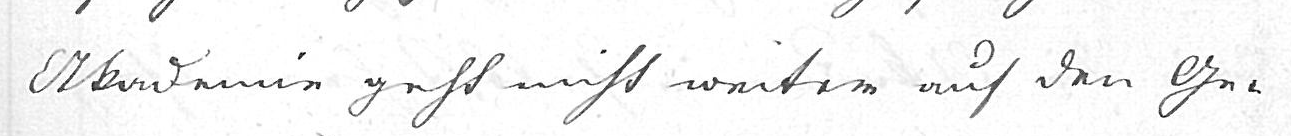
Akademie geht nicht weiter auf den Ge-
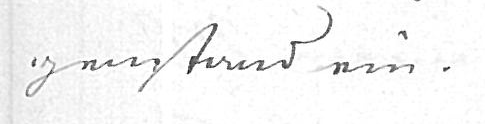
genstand ein.
